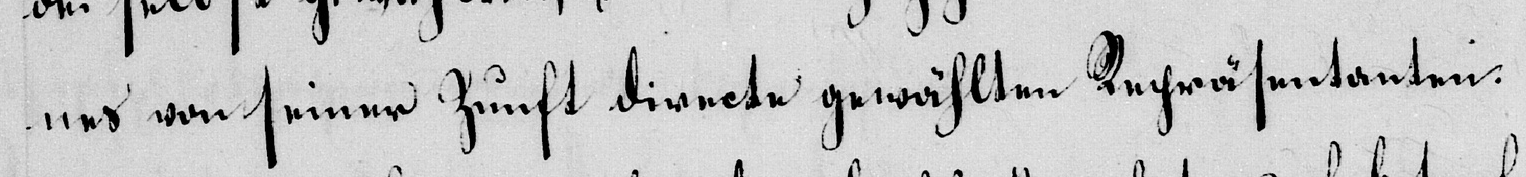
nes von seiner Zunft directe gewählten Repräsentanten.
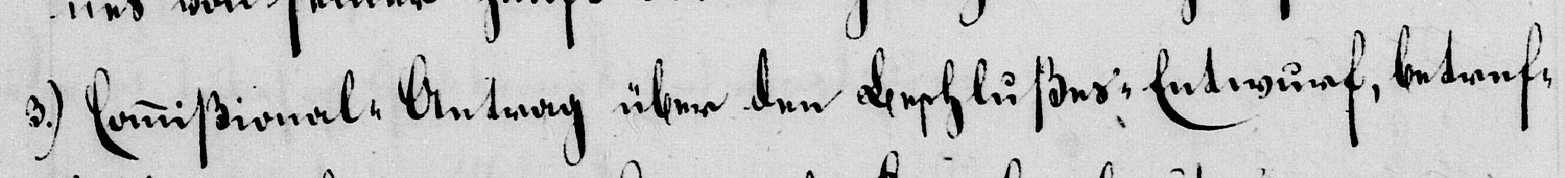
3.) Commißional-Antrag über den Beschlußes-Entwurf, betref¬
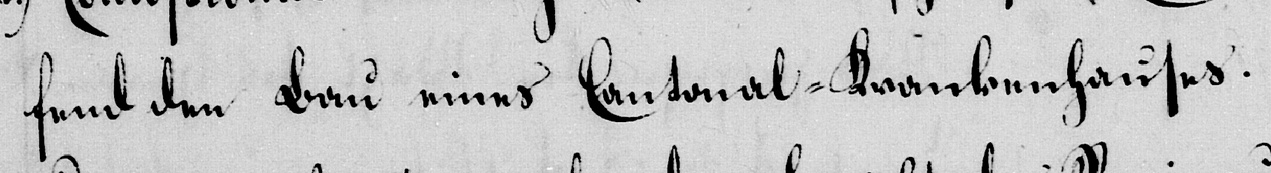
fend den Bau eines Cantonal-Krankenhauses.
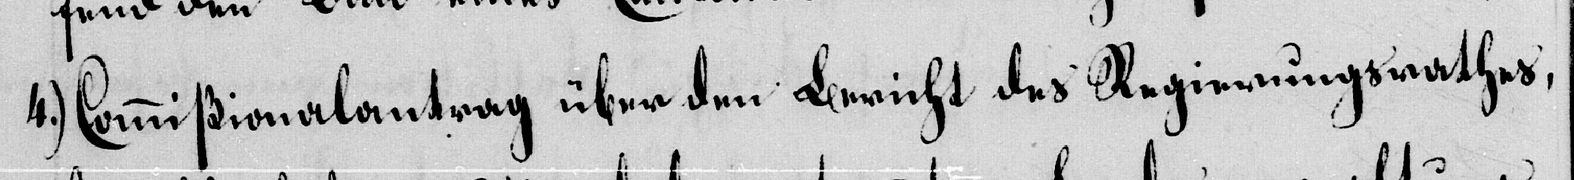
4.) Commißionalantrag über den Bericht des Regierungsrathes,
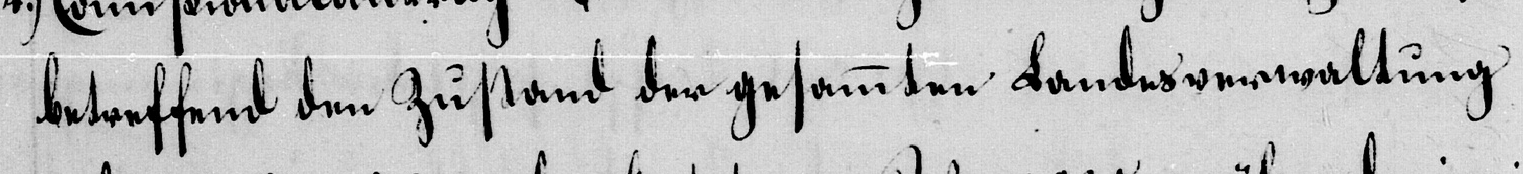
betreffend den Zustand der gesammten Landesverwaltung
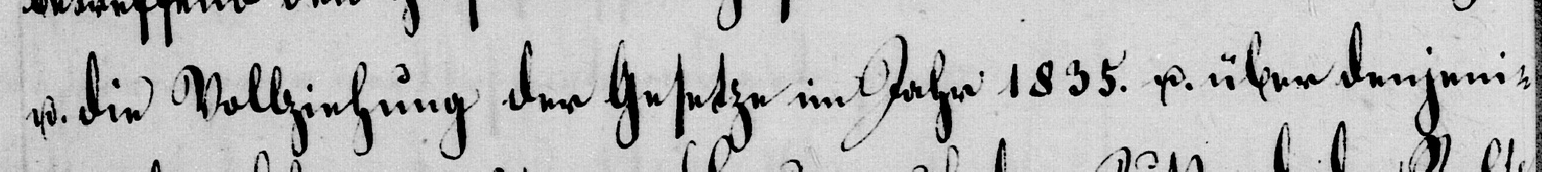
u. die Vollziehung der Gesetze im Jahr 1835. u. über denjeni¬
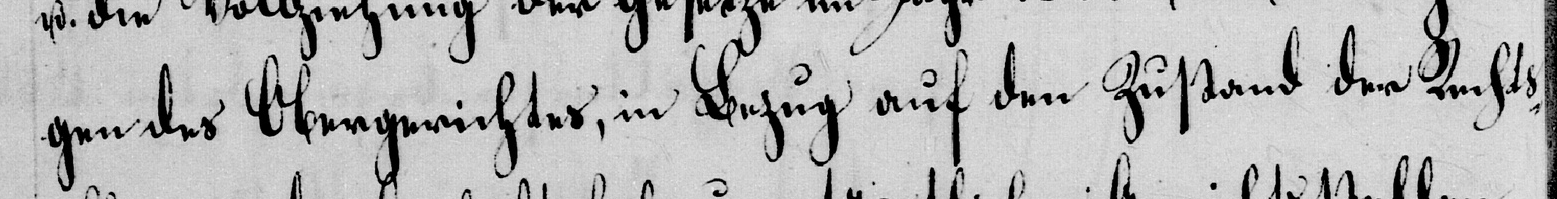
gen des Obergerichtes, in Bezug auf den Zustand der Rechts¬
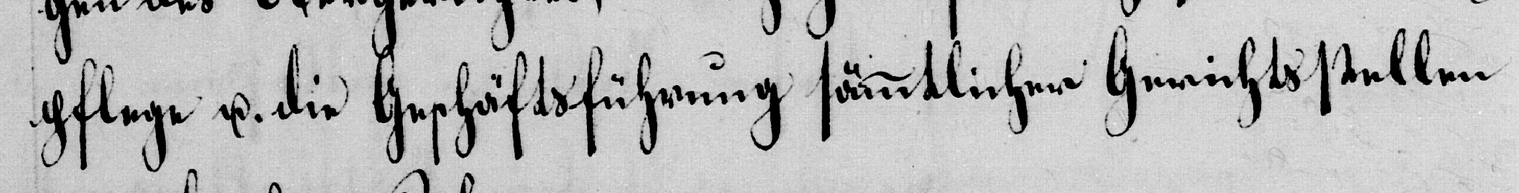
pflege u. die Geschäftsführung sämmtlicher Gerichtsstellen
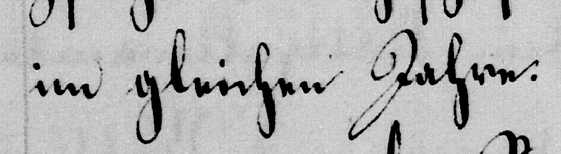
im gleichen Jahre.
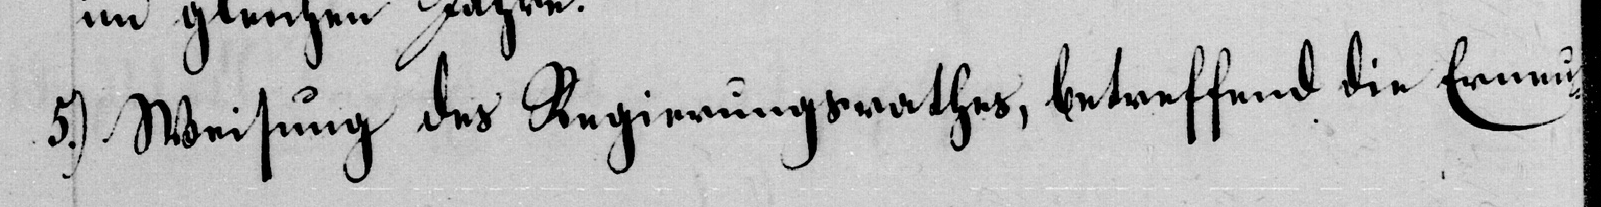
5.) Weisung des Regierungsrathes, betreffend die Erneu-
